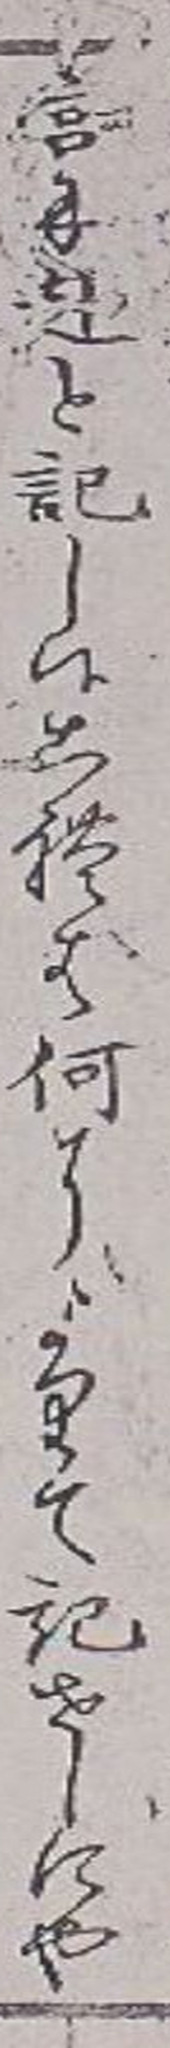宮に赴と記し候これは何によりて記せしにや
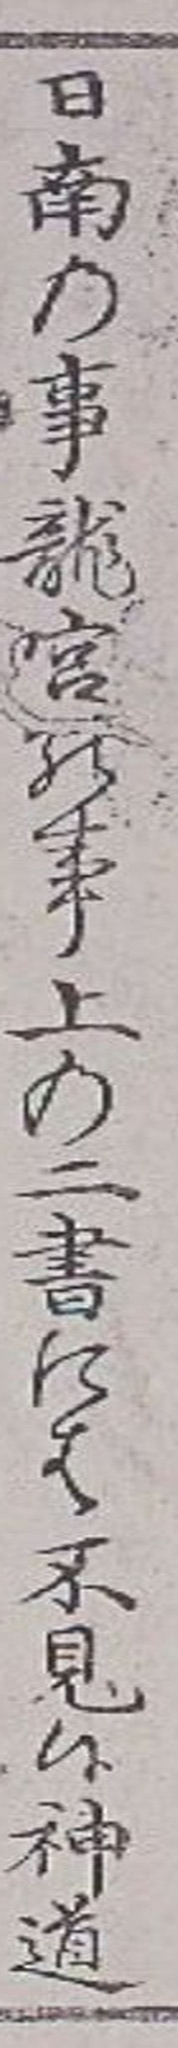日南の事竜宮の事上の二書には不見候神道
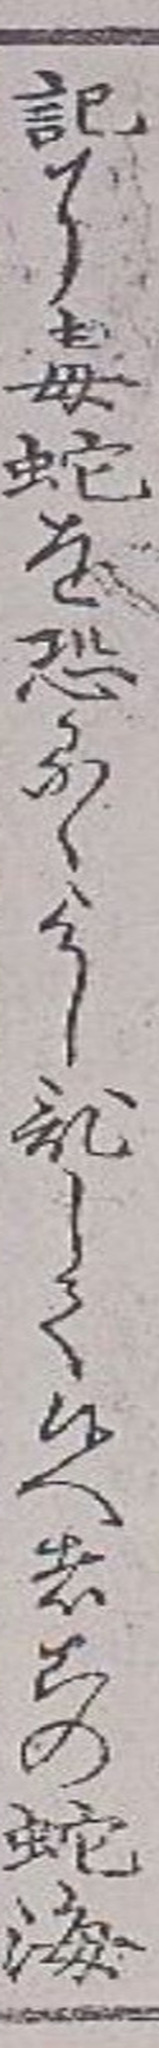記にも母蛇を恐るゝよし記して候へはこの蛇海

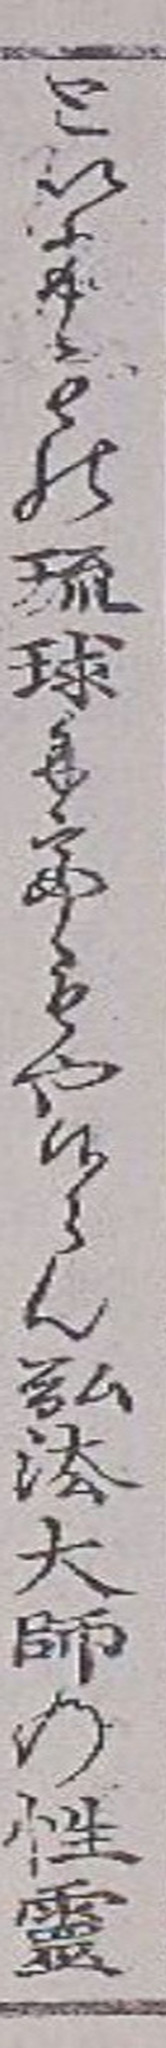といふもの琉球にてもや候らん弘法大師の性霊
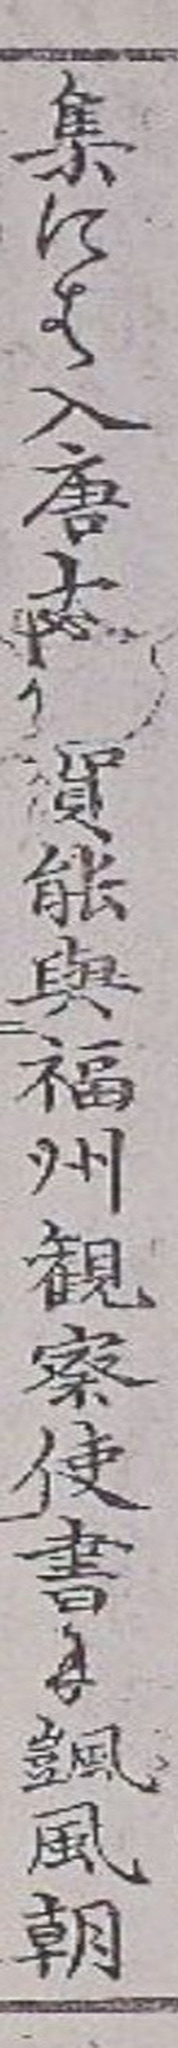集には入唐賀能与福州観察使書に凱風朝
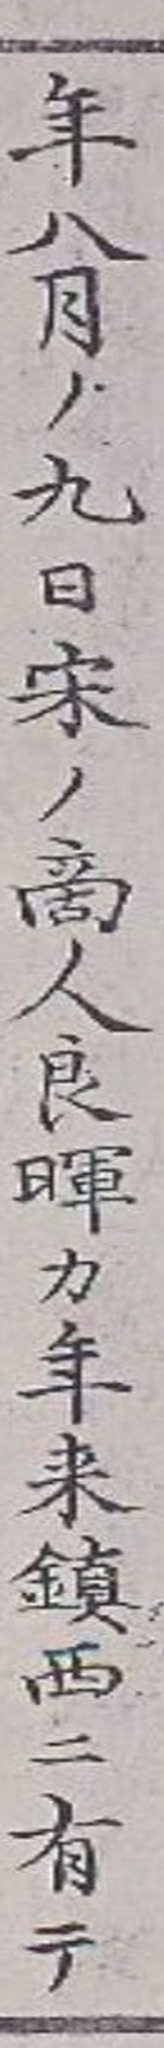年八月ノ九日宋ノ商人良暉カ年来鎮西ニ有テ
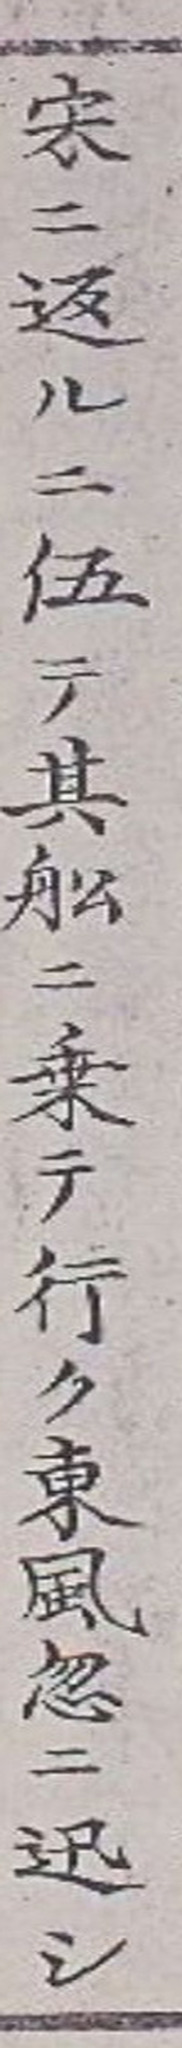宋ニ返ルニ伍テ其船ニ乗テ行ク東風忽ニ迅シ
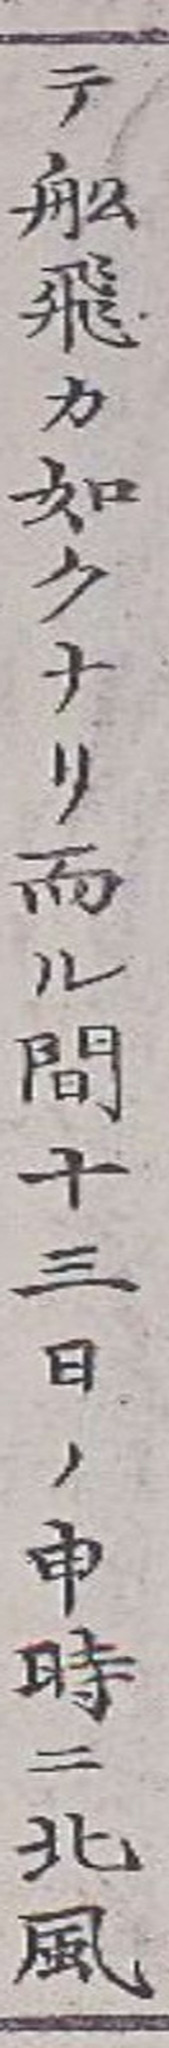テ船飛カ如クナリ而ル間十三日ノ申時ニ北風
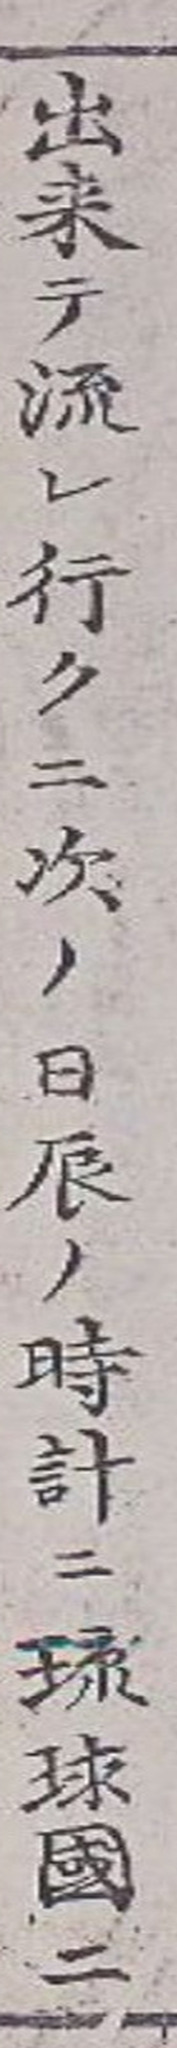出来テ流レ行クニ次ノ日辰ノ時計ニ琉球国ニ
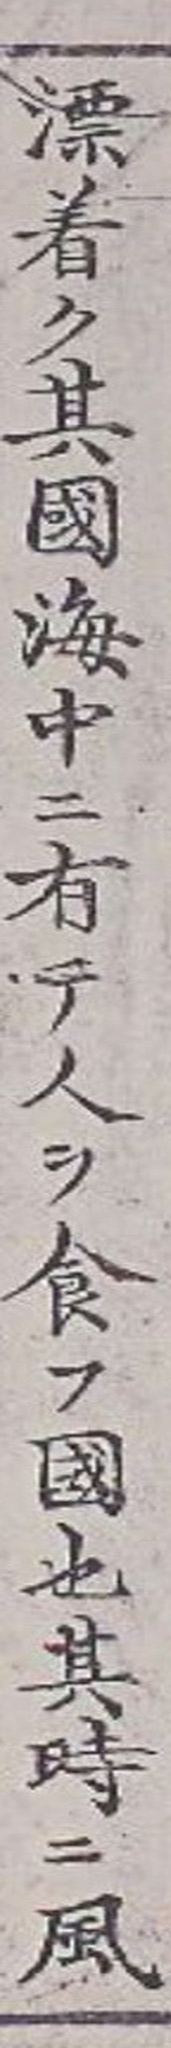漂着ク其国海中ニ有テ人ヲ食フ国也其時ニ風
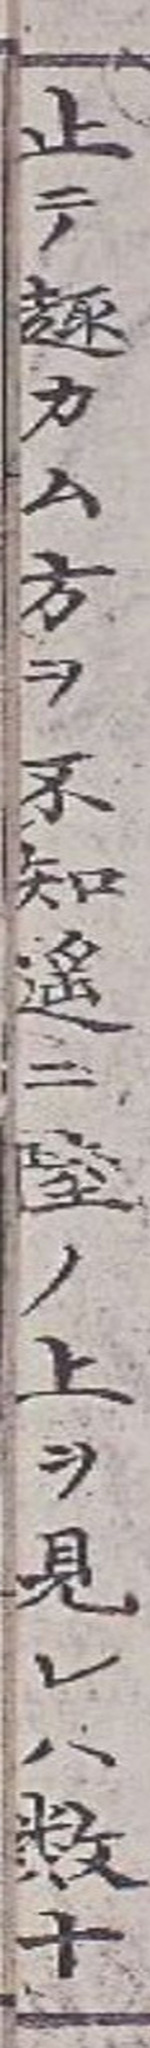止テ趣カム方ヲ不知遥ニ陸ノ上ヲ見レハ数十
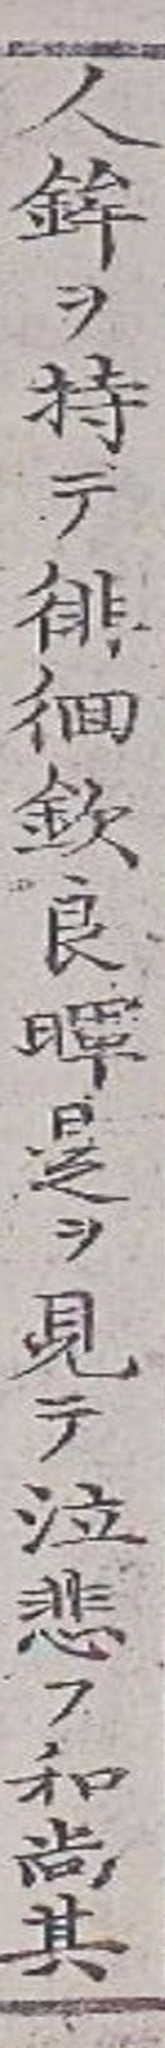人鉾ヲ持テ徘徊欽良暉是ヲ見テ泣悲フ和尚其
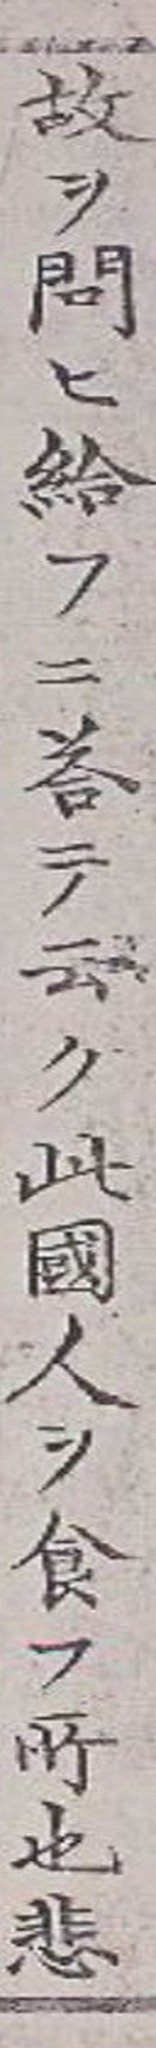故ヲ問ヒ給フニ答テ云ク此国人ヲ食フ所也悲
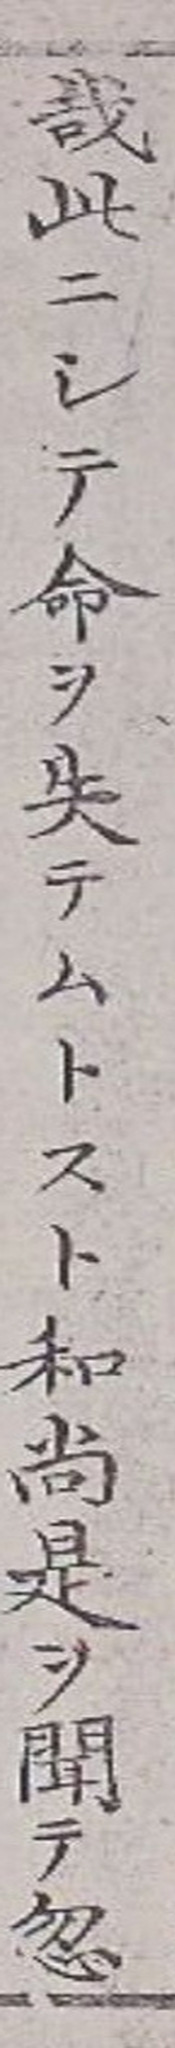哉此ニシテ命ヲ失テムトスト和尚是ヲ聞テ忽
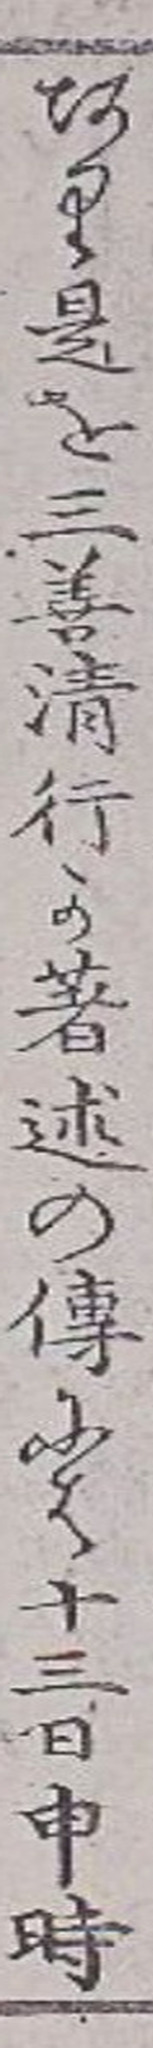あり是を三善清行か著述の伝には十三日申時
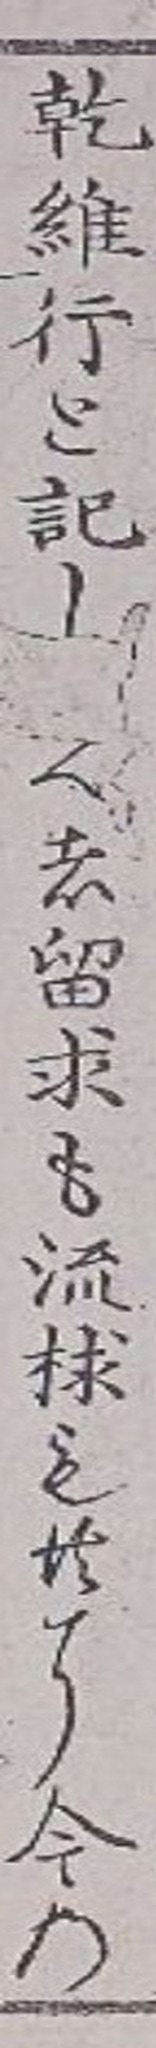乾維行と記しは留求も流梂も共に今の
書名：琉球状
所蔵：University of the Ryukyus Library
